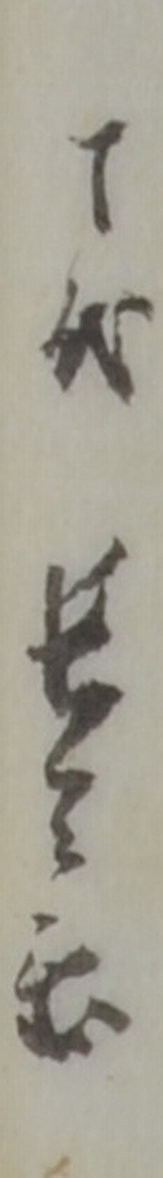町代長兵衛
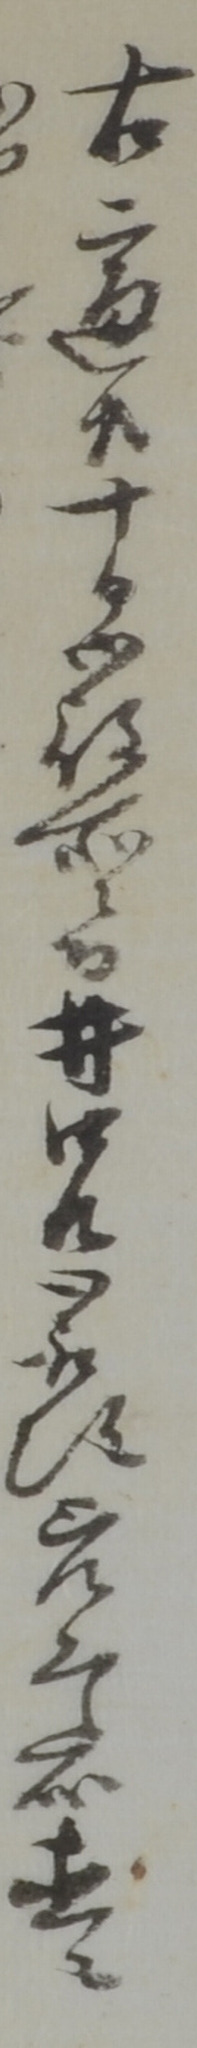右二通共十日御役所ニ而井口氏御取次差上候所直ニ
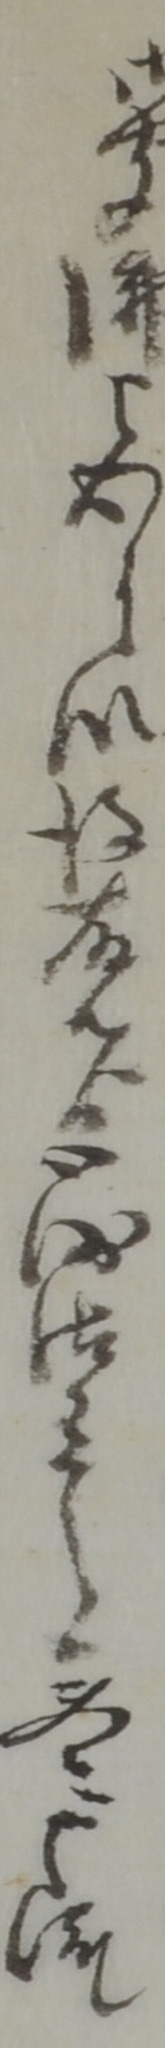御聞済被成下候段後藤氏ゟ御沙汰有之候夫々へ申渡候
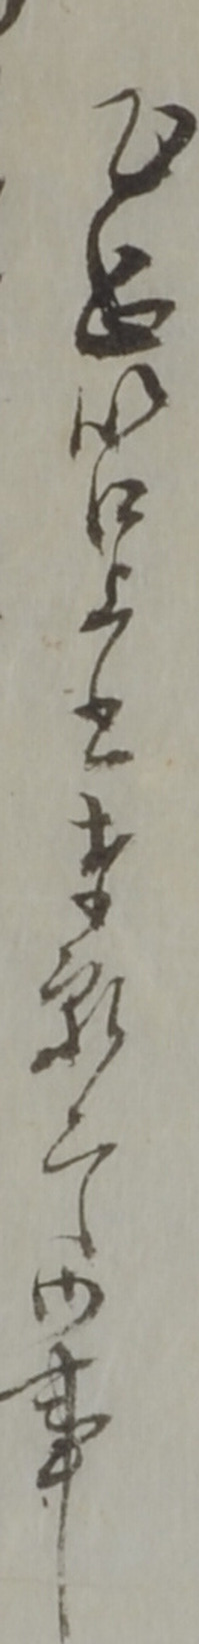乍恐以口上書奉願上候御事
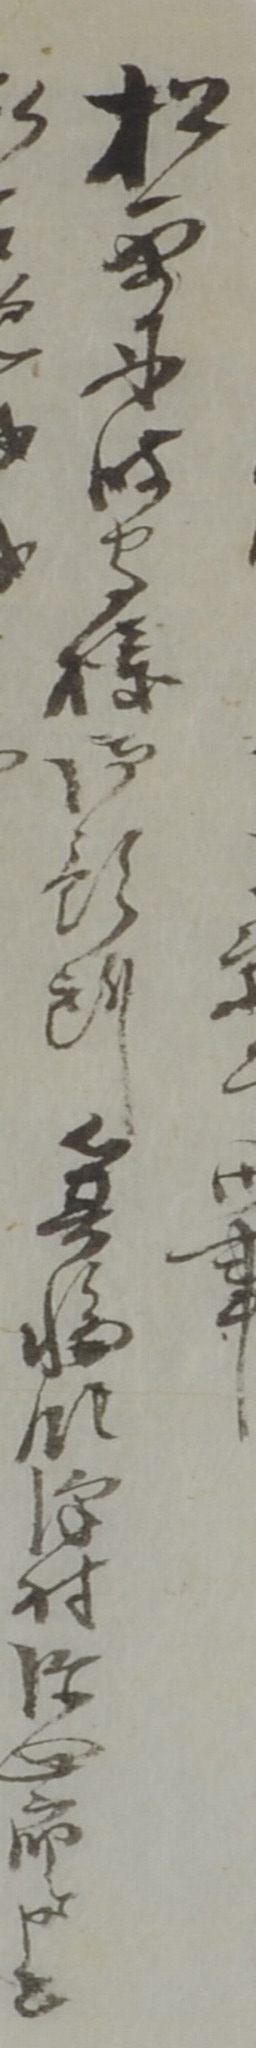松平丹波守様御預所箕輪領澤村弥四郎と申者
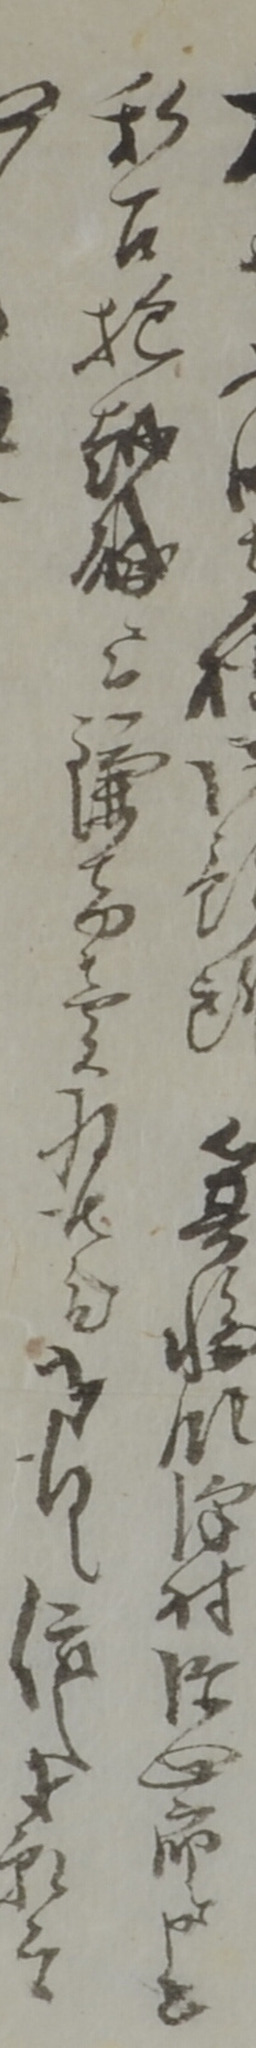私召抱越職ニ而鎌商売為仕度奉存候依之奉願上候
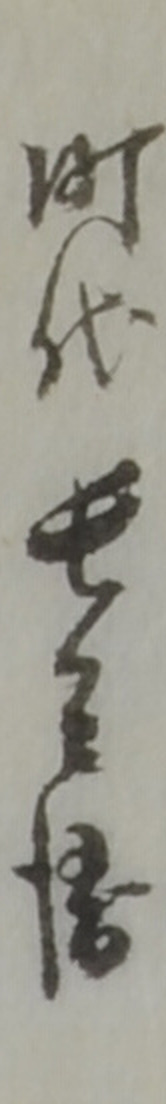町代長兵衛
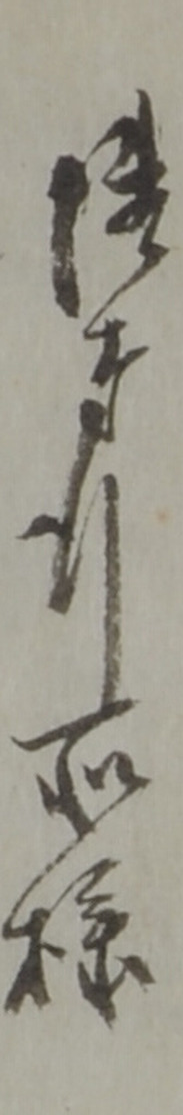御奉行所様

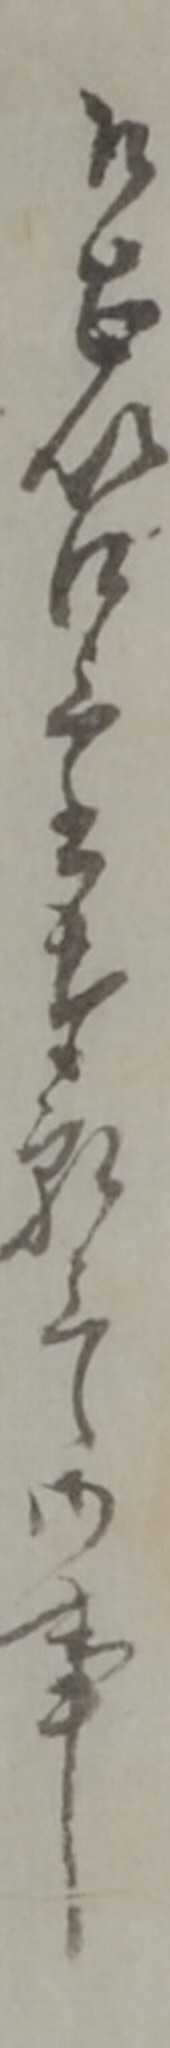乍恐以口上書奉願上候御事
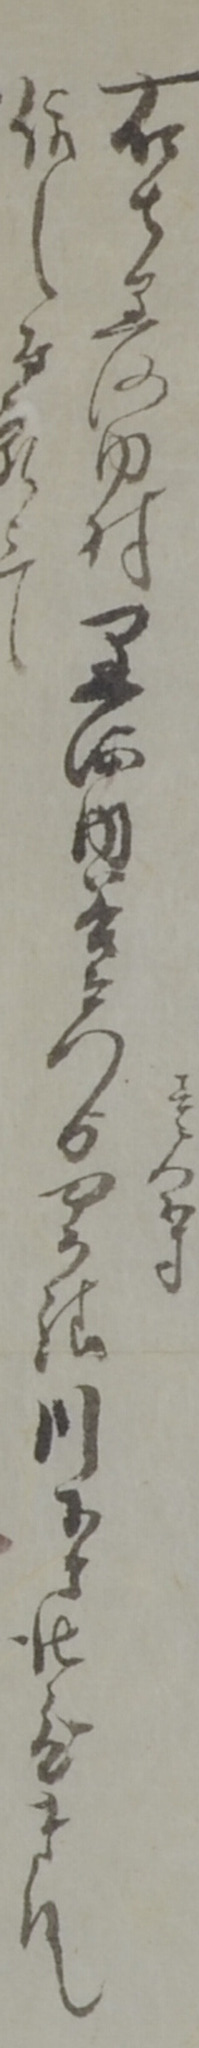右者黒河内村黒河内谷衛門ゟ買請川下ケ仕度奉存候
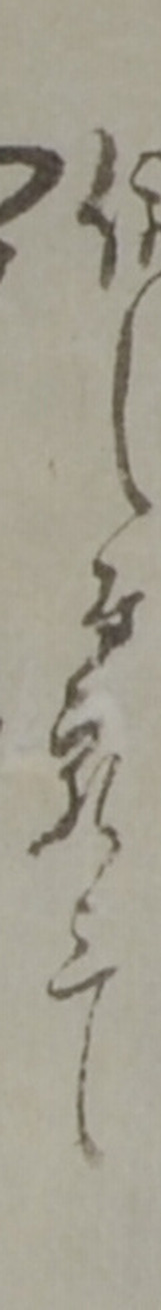依之奉願上候
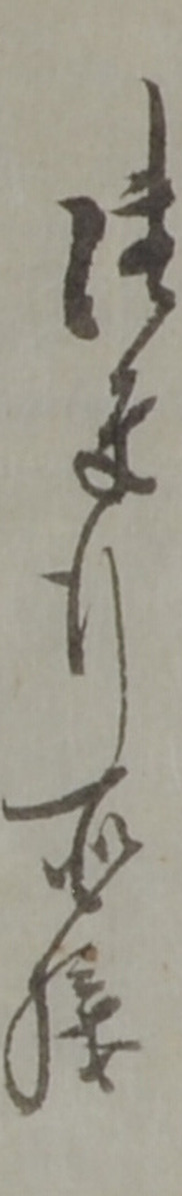御奉行所様
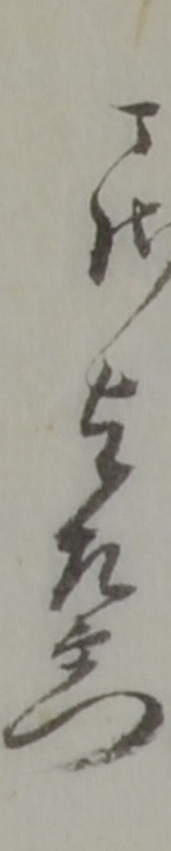丁代与左衛門
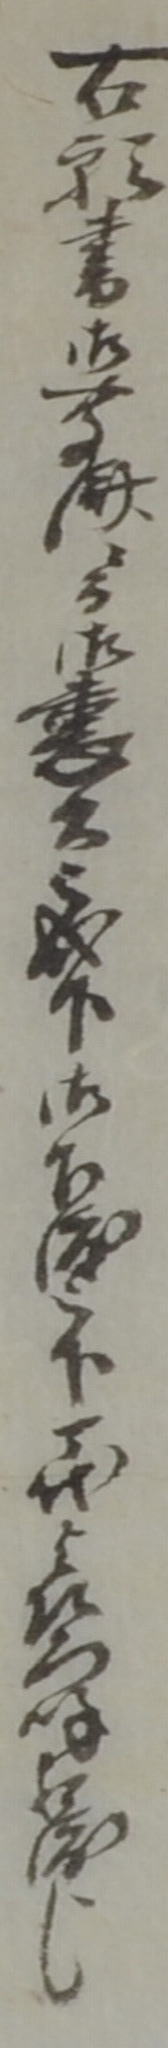右願書御聞済ニ而御裏書被成下御下渡被下丁代与左衛門呼相渡申候
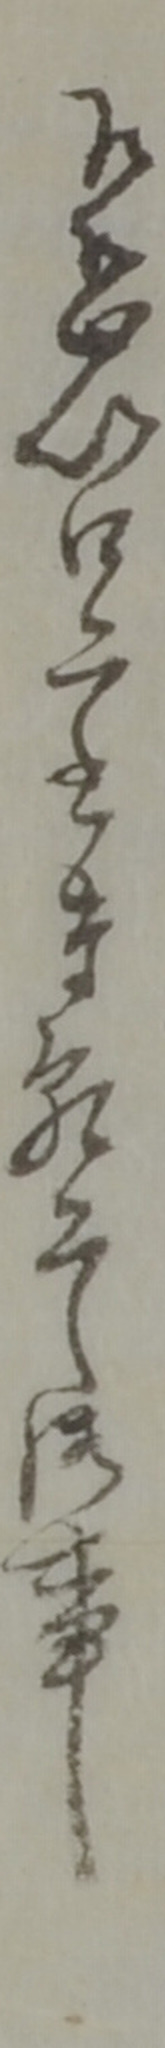乍恐以口上書奉願上候御事
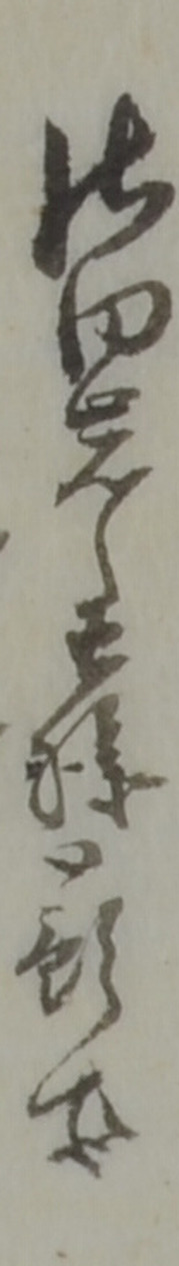池田岩之丞様御預所
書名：諸願書控簿
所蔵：伊那市立高遠町図書館・合同会社AMANE
